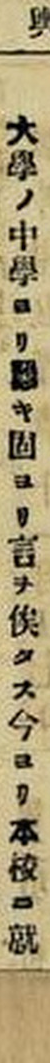大学ノ中学ヨリ難キ固ヨリ言ヲ俟タス今ヨリ本校ニ就
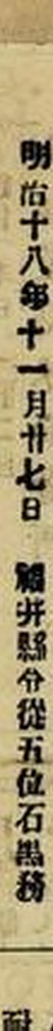明治十八年十一月廿七日福井県令従五位石黒務
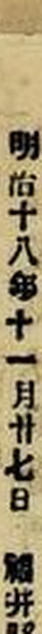明治十八年十一月廿七日
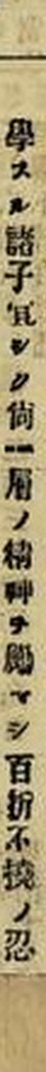学スル諸子宜シク尚一層ノ精神ヲ励マシ百折不撓ノ忍
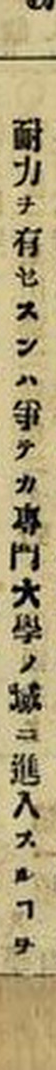耐力ヲ有セスンハ争テカ専門大学ノ域ニ進入スルヿヲ
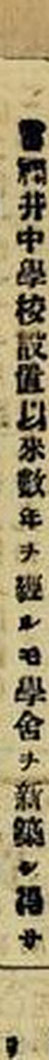嘗福井中学校設置以来数年ヲ経ルモ学舎ヲ新築シ得サ
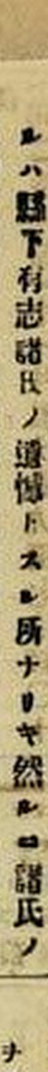ルハ県下有志諸氏ノ遺憾トスル所ナリキ然ルニ諸氏ノ
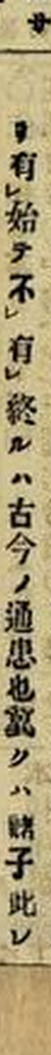リ有始テ不有終ルハ古今ノ通患也冀クハ諸子此レ
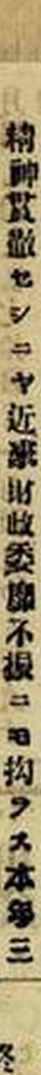精神貫徹セシニヤ近来財政委靡不振ニモ拘ラス本年三
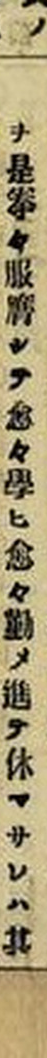ヲ是拳々服膺シテ愈々学ヒ愈々勤メ進テ休マサレハ其
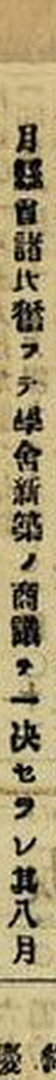月県会諸氏奮ツテ学舎新築ノ商議ヲ一決セラレ其八月
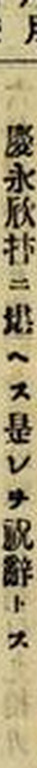慶永欣抃ニ堪ヘス是レヲ祝辞トス
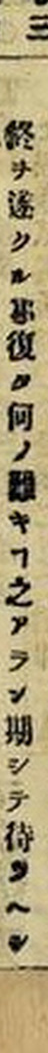終ヲ遂クル事復タ何ノ難キヿ之アラン期シテ待ツヘシ
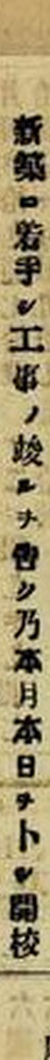新築ニ着手シ工事ノ竣ルヲ告ク乃本月本日ヲ卜シ開校
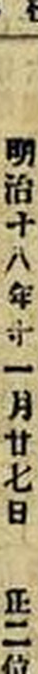明治十八年十一月廿七日
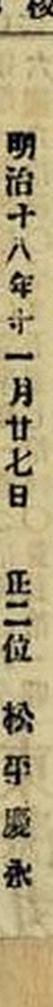明治十八年十一月廿七日正二位松平慶永
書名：温古集 五巻
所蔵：福井県文書館 Fukui Prefectural Archives
